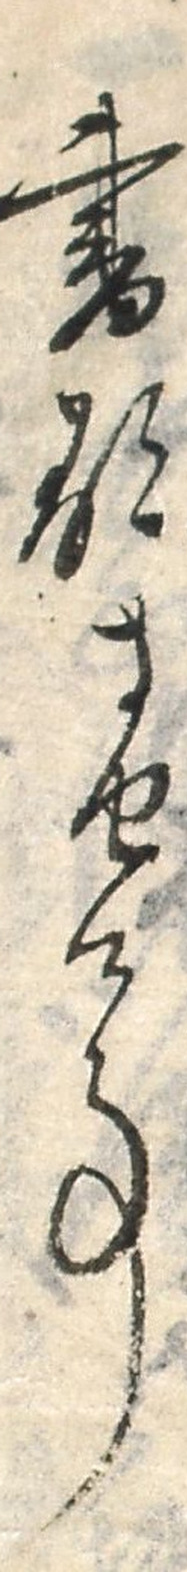書顕させ候事
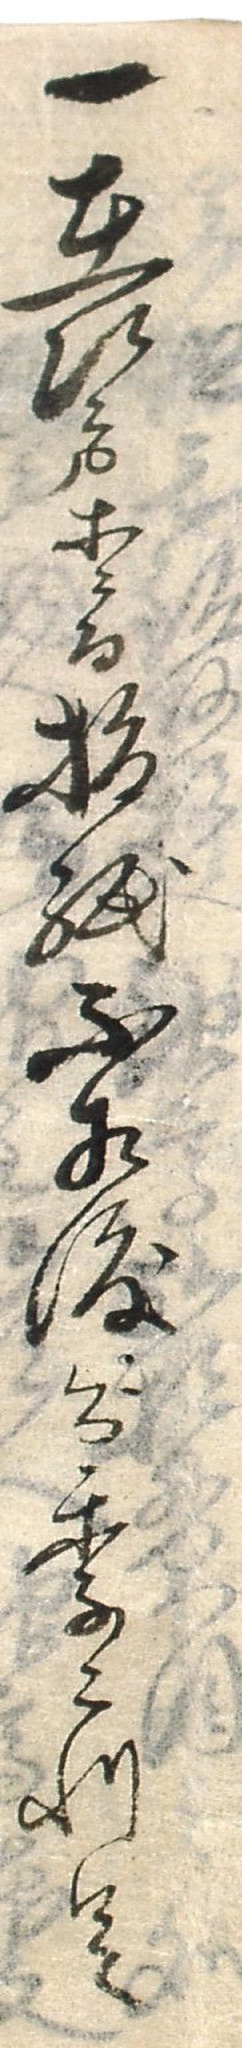一在郷方等に而指紙不相渡分季々利足
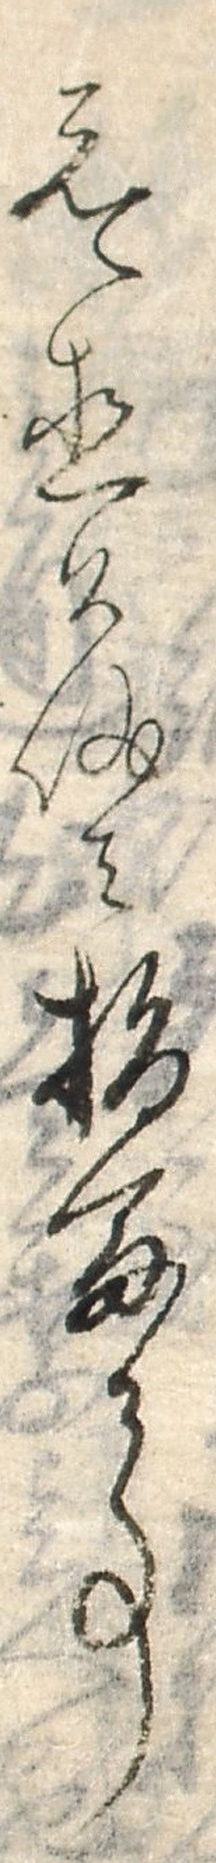元へ直候儀は指留候事
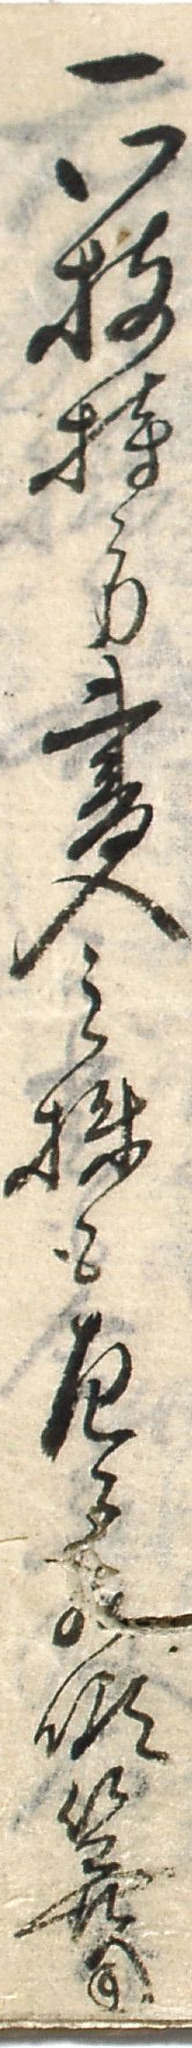一御扶持方書入之株も左之仮算用
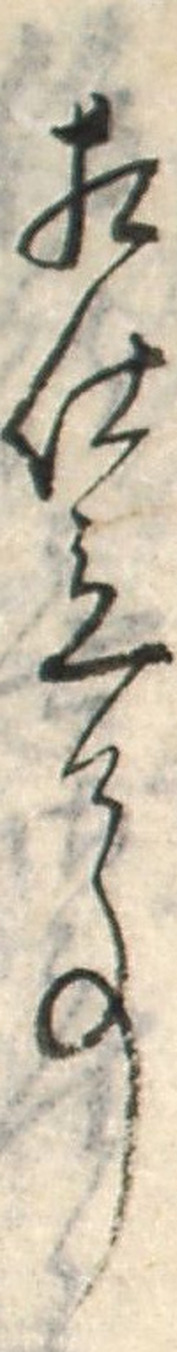相仕立候事
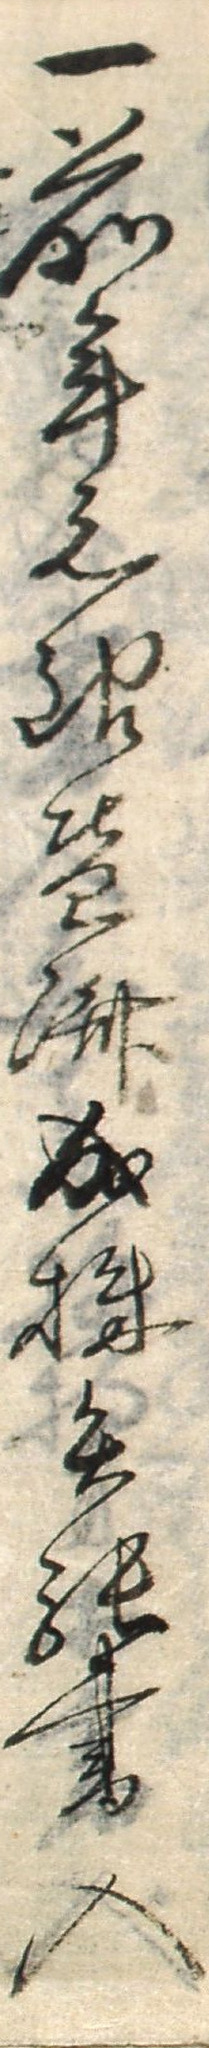一前年元銀皆済成株矢張書入
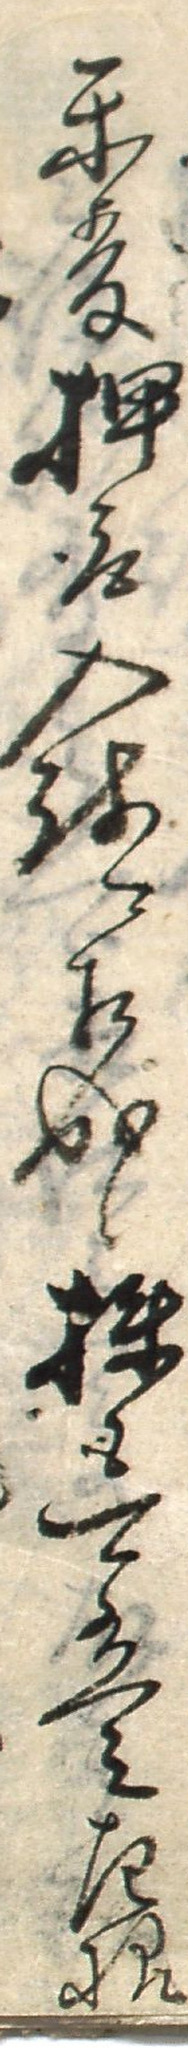米麦押取入残に相成候株も可有之左様
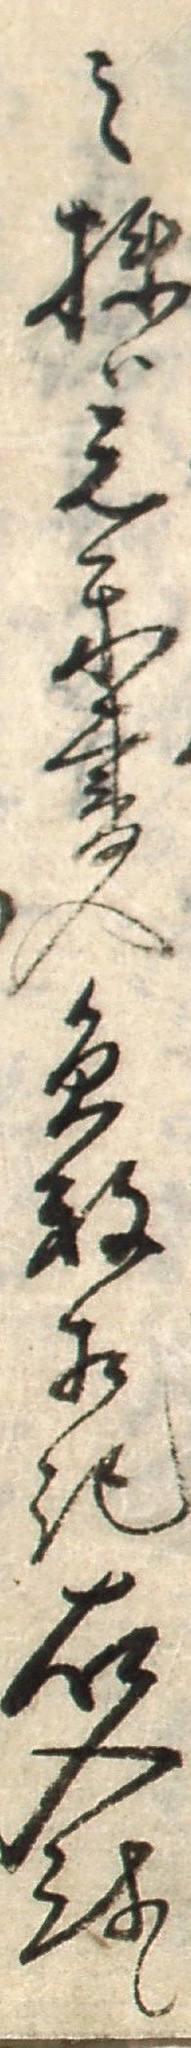之株は元米書入員数相記右入残し
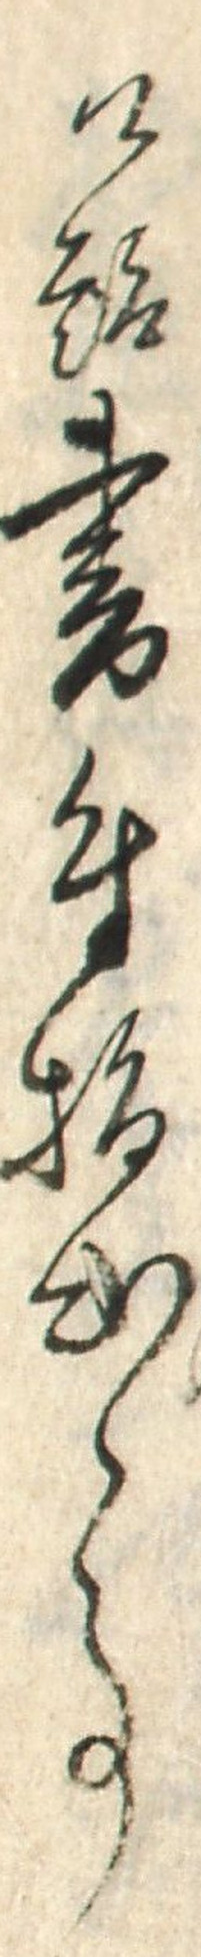候趣書付指出候事

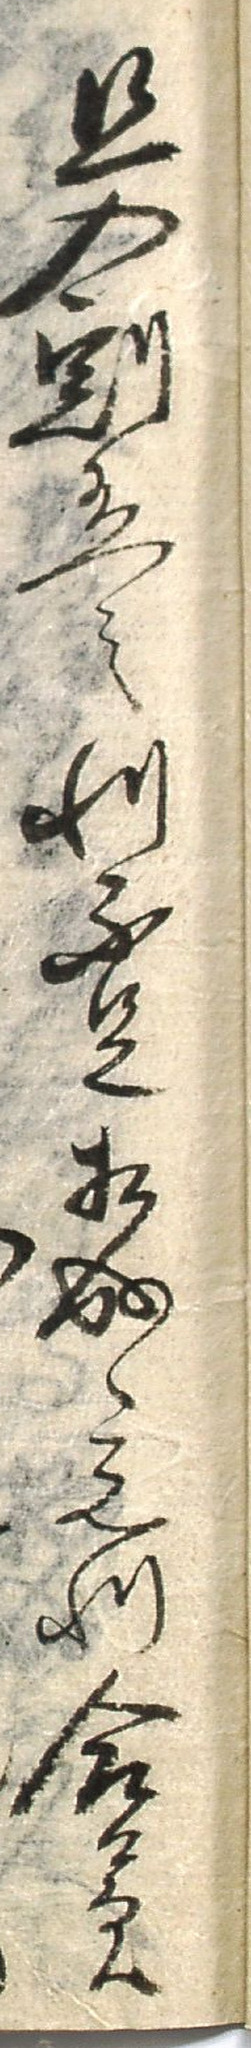且入割有之利不足相成候元利合候而は
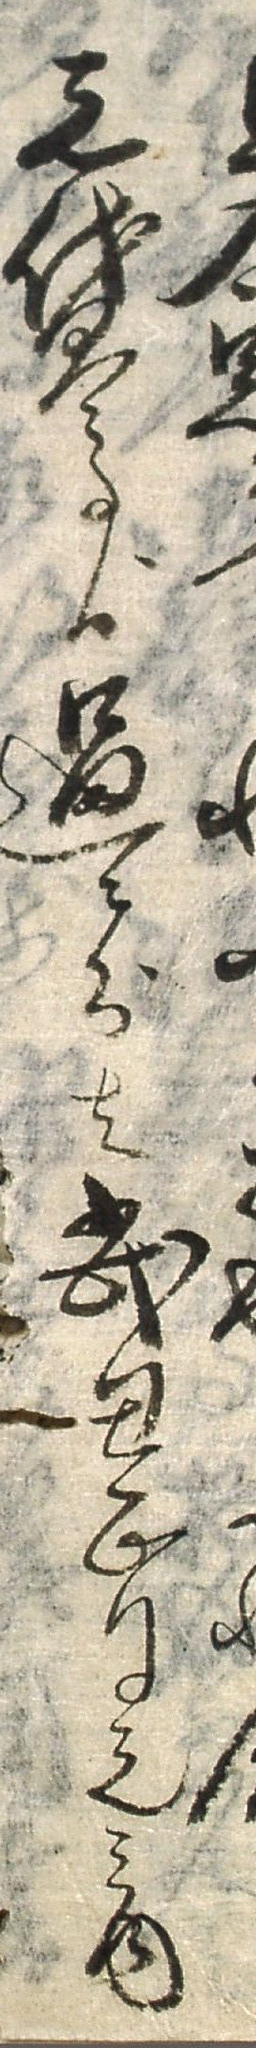元貸高ゟ過候分は当丑正月元之内
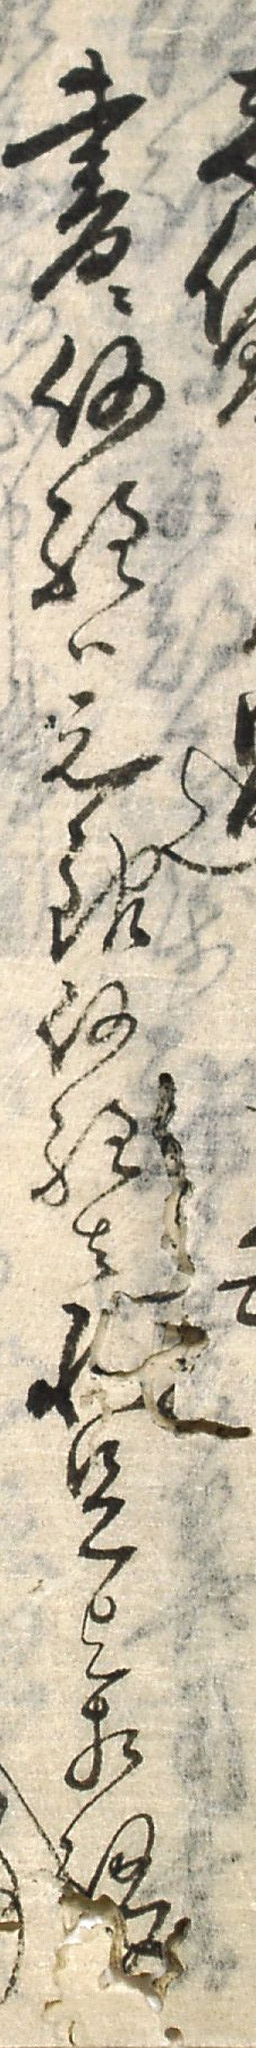書に何程は元銀何程は利足と相認め候事
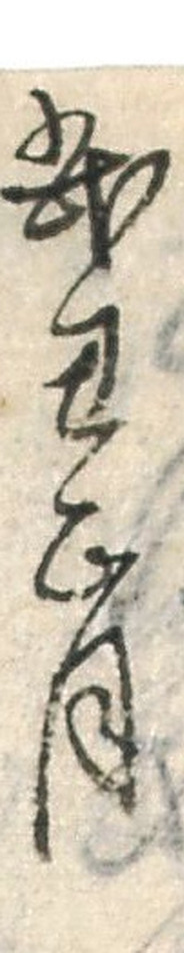当丑正月
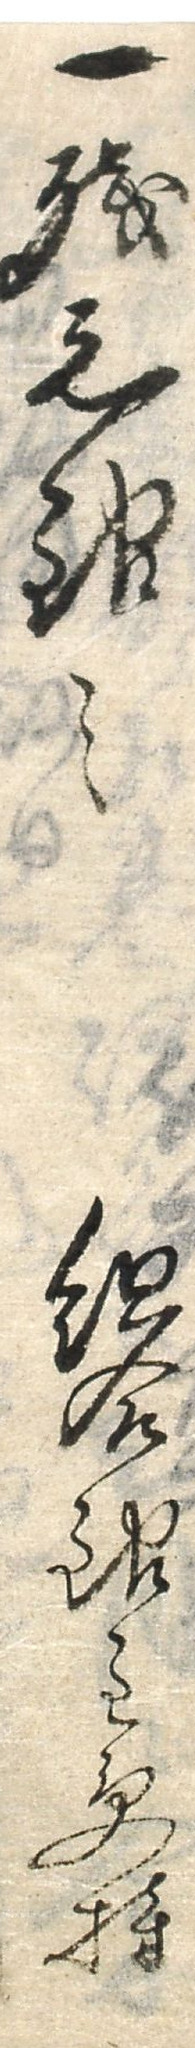一残元銀～組合銀主受持
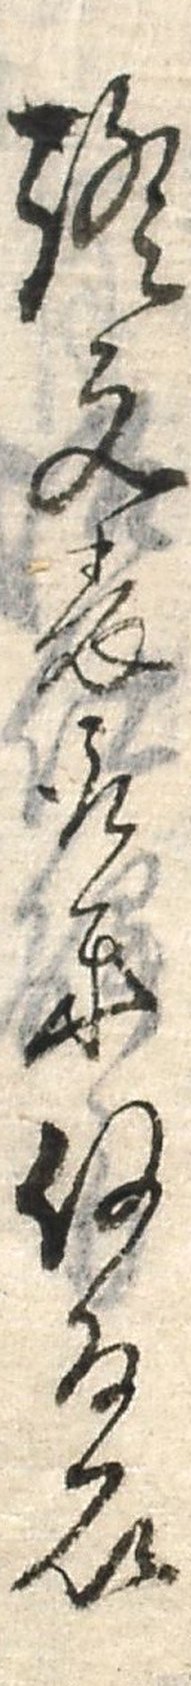証文表取米何百石
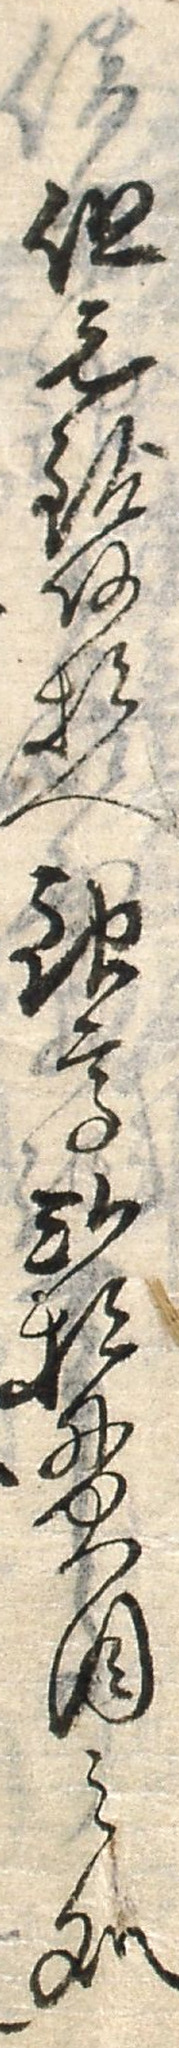但元銀何十人銀高弐拾貫目之処
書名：御家中并無格御奉公人借銀御仕解一件御書付写其余共控
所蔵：鳴門教育大学 Naruto University of Education
